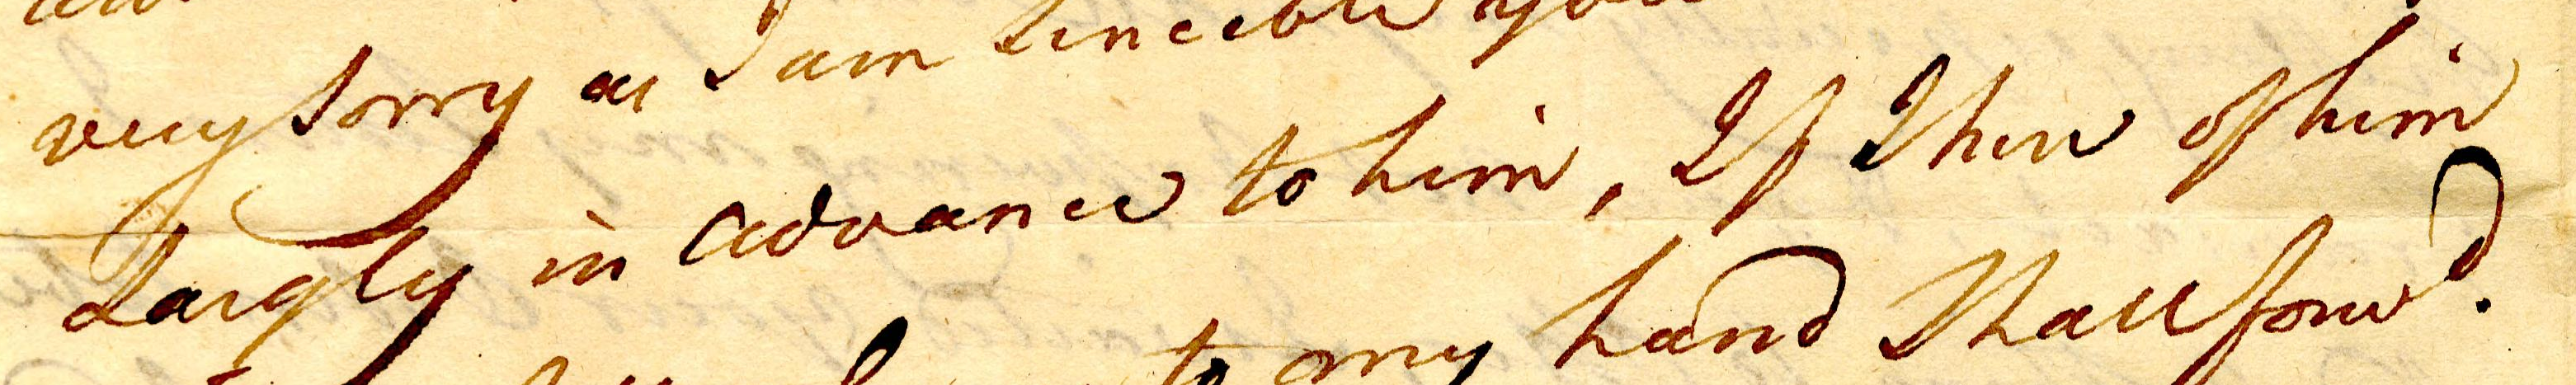Largly in advance to him, If I hear of him
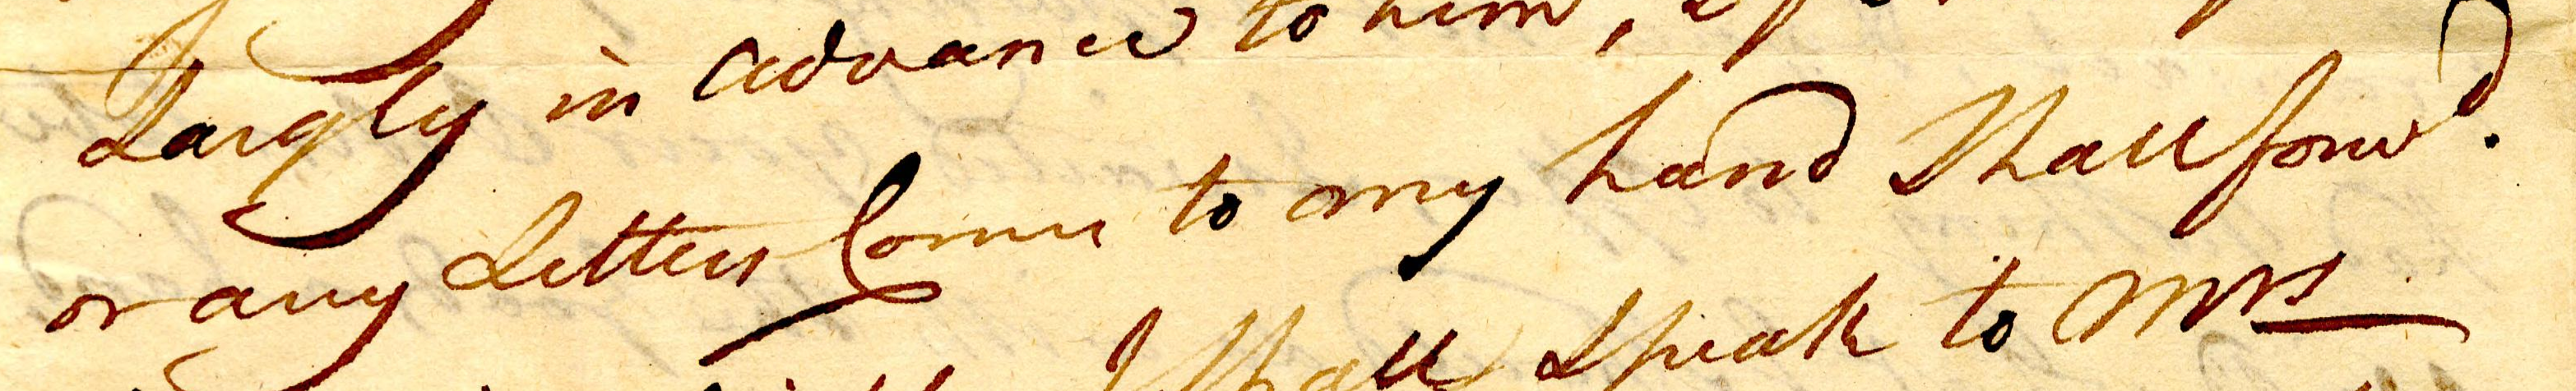or any Letters come to my hand shall forw^d
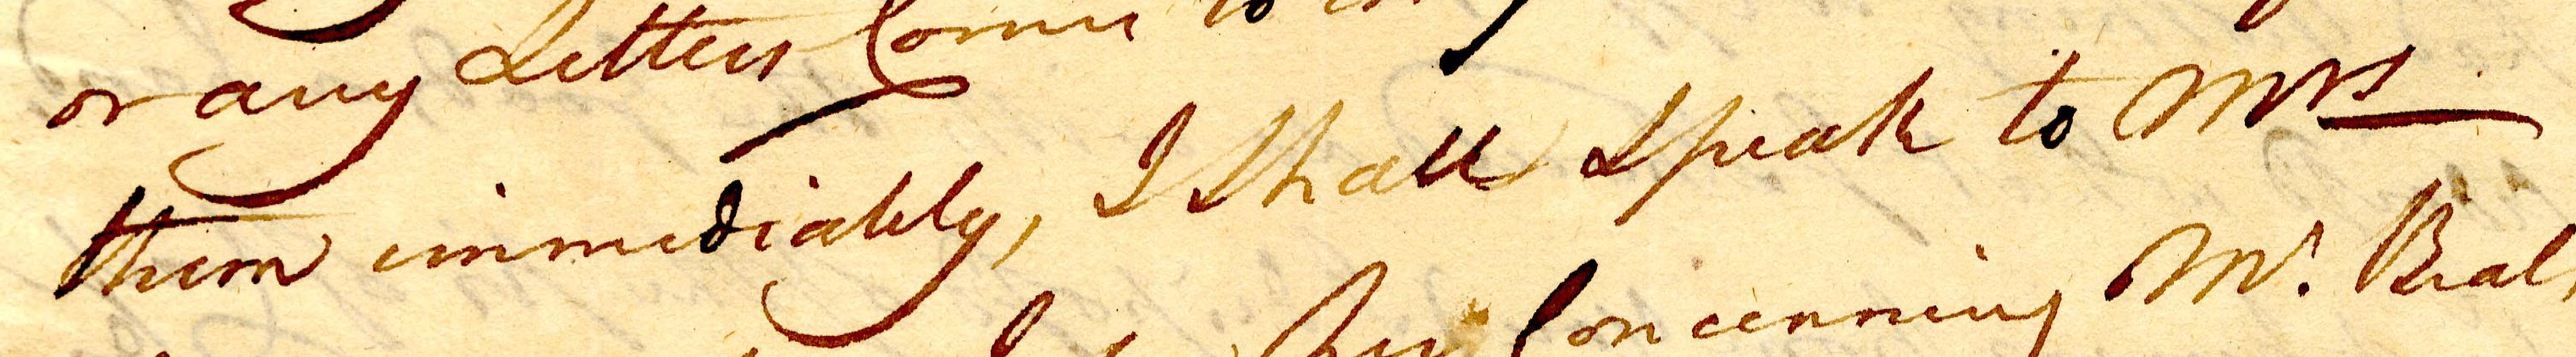them immediately, I shall speak to M^rs
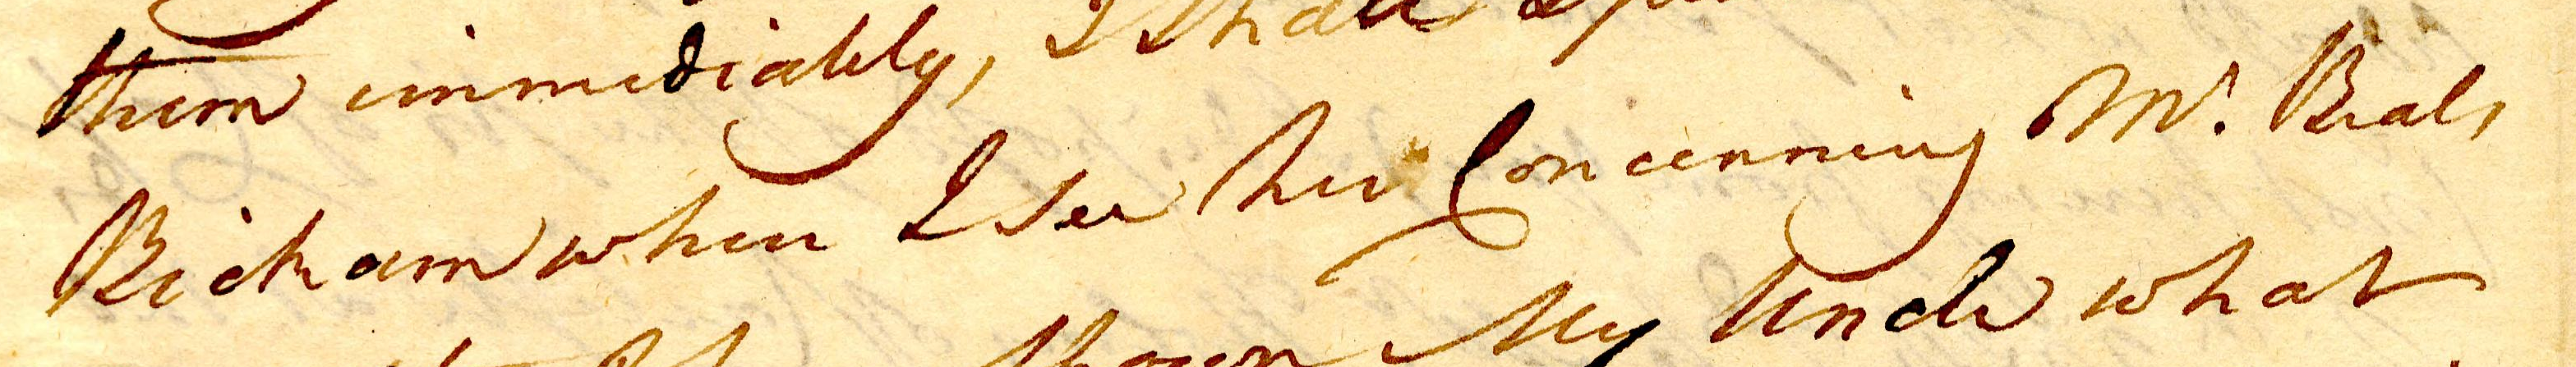Bickam when I see her Concerning M^r. Beals
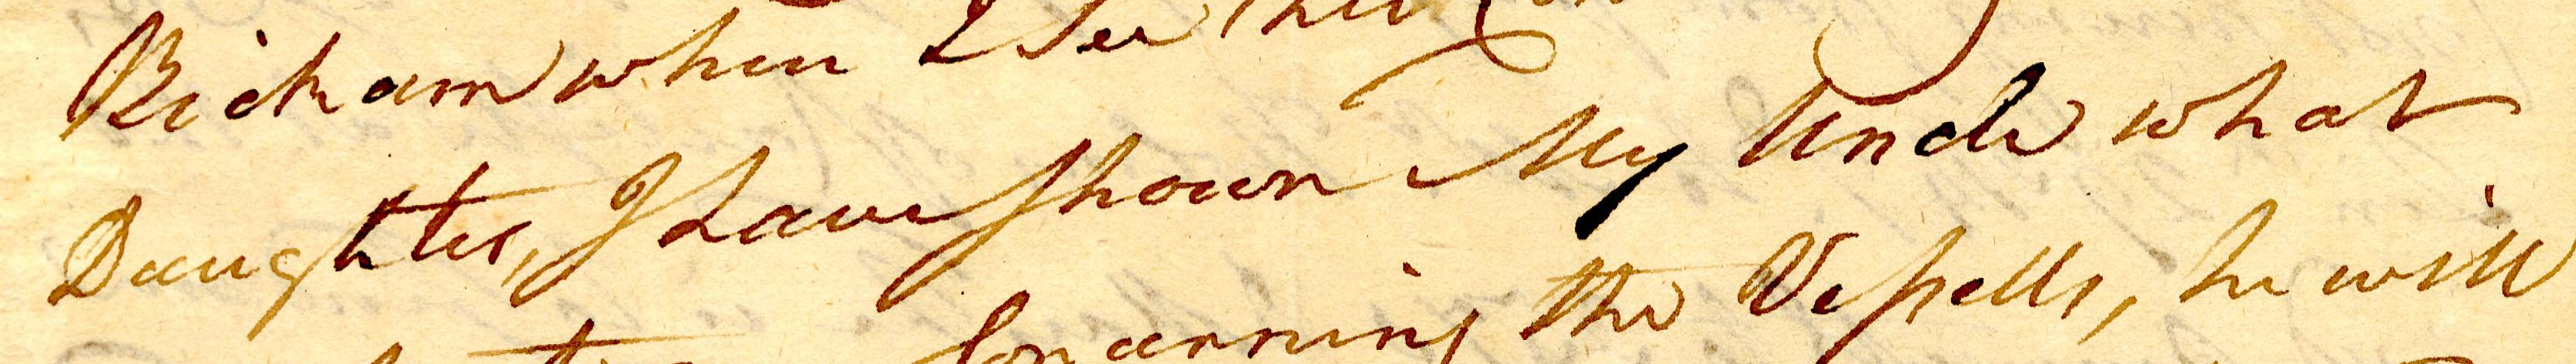Daughtes I have shown My Uncle what
